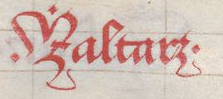.Żaltarz.
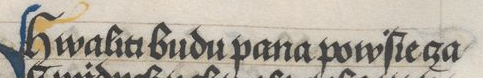hwaliti budu pana powẛie cza¬
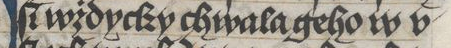ſi wżdycky chwala geho w v¬
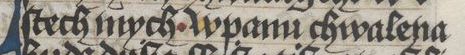ſtech mych.W panu chwalena
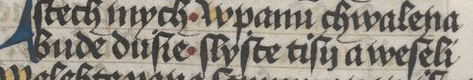bude duẛie.ſlyẛte tiẛij a weſelí
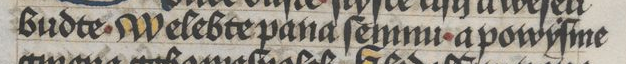budte.Welebte pana ſemnu.a powyẛme
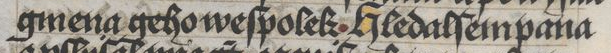gmena geho weſpolek.Hledalſem pana
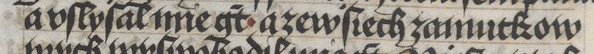a vſlyẛal mie ḡt.a zewẛiech zamutkow
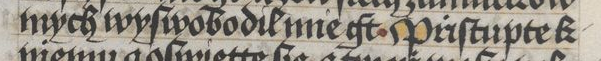mych wyſwobodil mie ḡt.Pṙiſtupte k¬
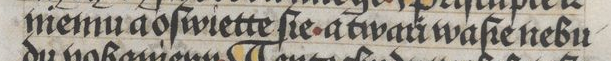niemu a oſwiette ſie.a twaṙi waſie nebu¬
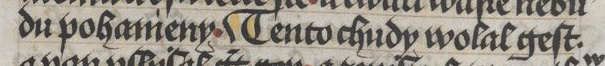du pohanieny.Tento chudy wolal geſt.
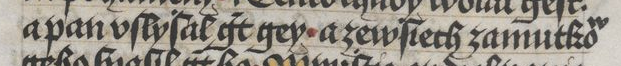a pan vſlyẛal ḡt gey.a zewẛiech zamutkow
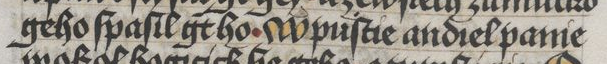geho ſpaſil ḡt ho.W puẛtie andiel panie
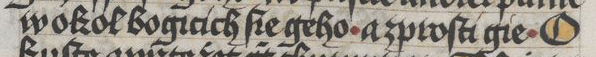w okol bogicích ſie geho.a zproſtí gie.O¬
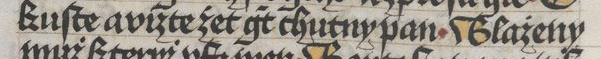kuſte avizte żet ḡt chutny pan.Blażeny
